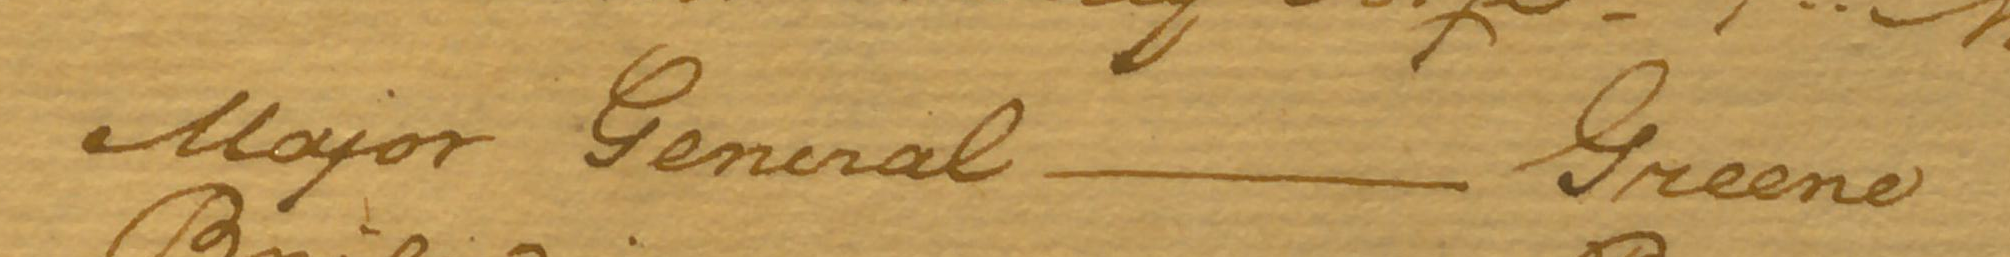Major General- Greene
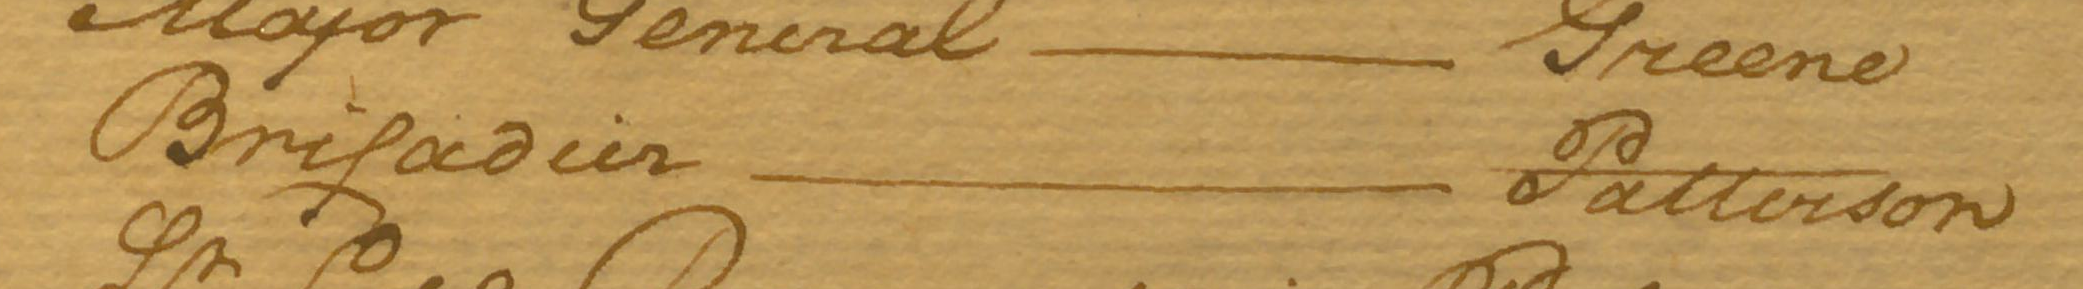Brigadier- Patterson
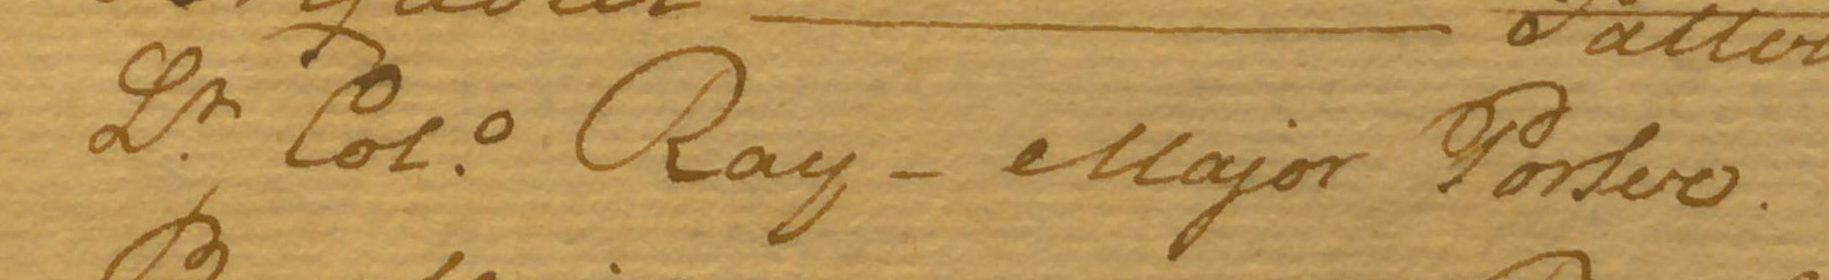L^t. Col^o. Ray- Major Porter.
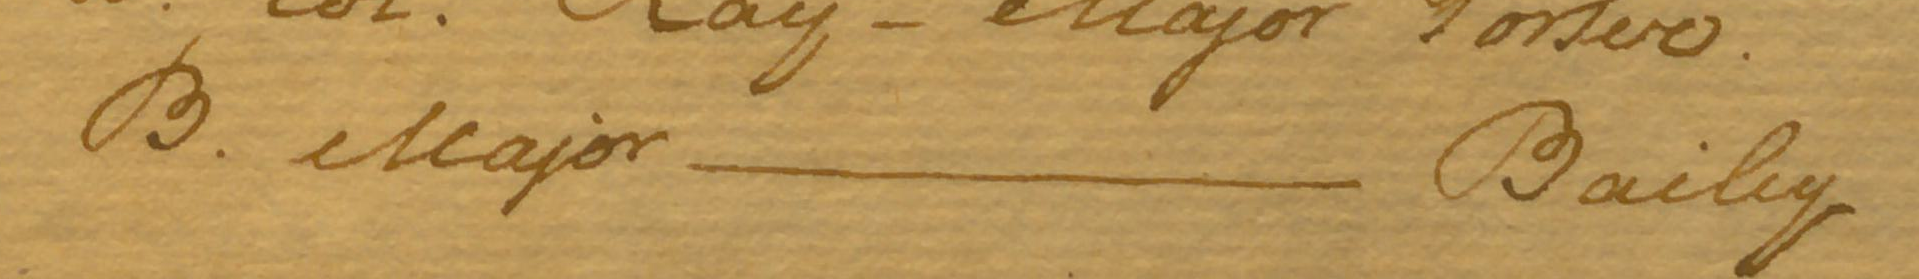B. Major- Bailey
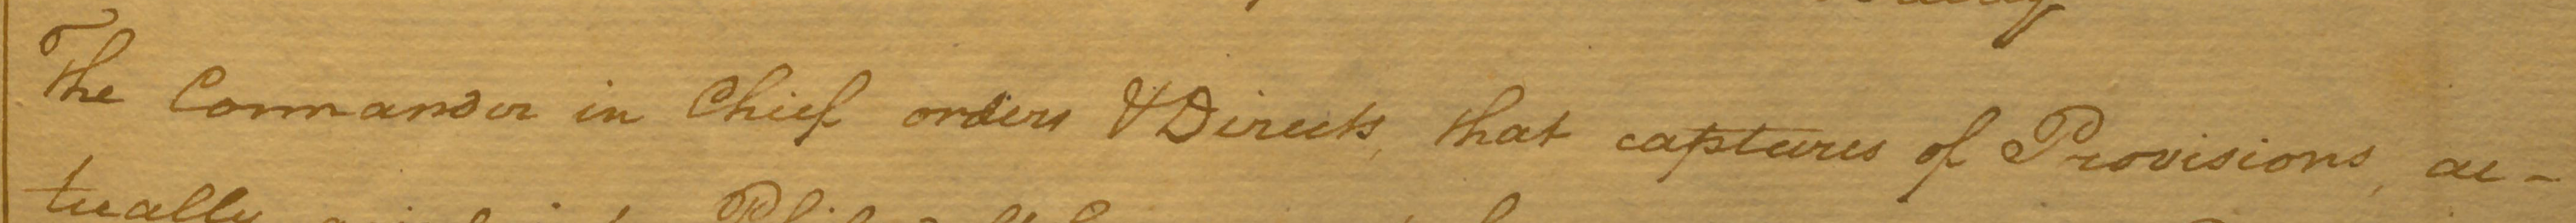The Commander in Chief orders & Directs that captures of Provisions ac-
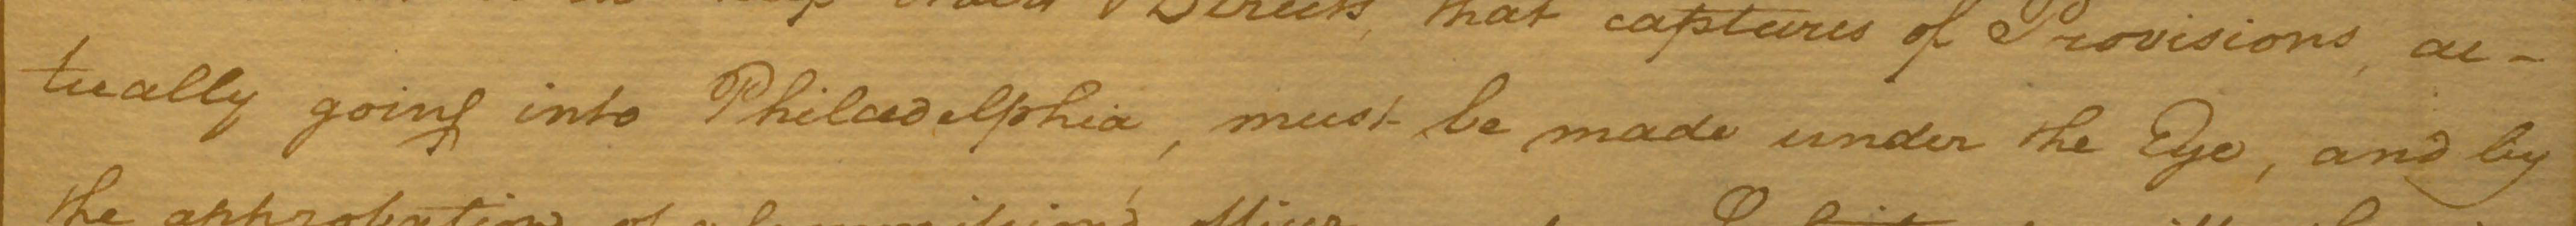tually going into Philadelphia, must be made under the Eye, and by
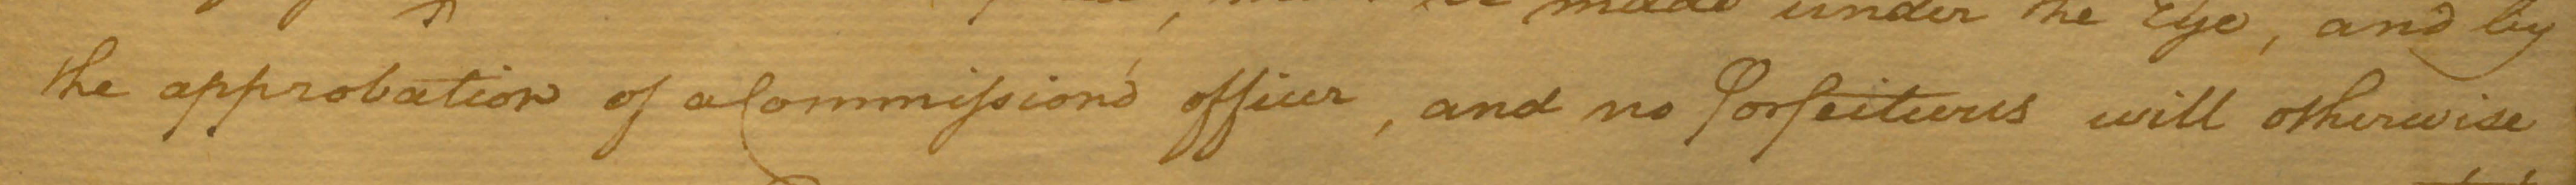the approbation of a Commission'd officer, and no forfeitures will otherwise
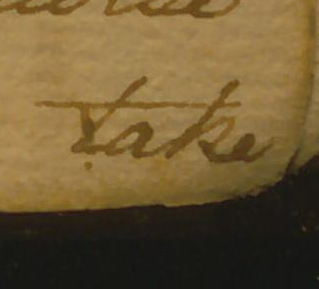take
